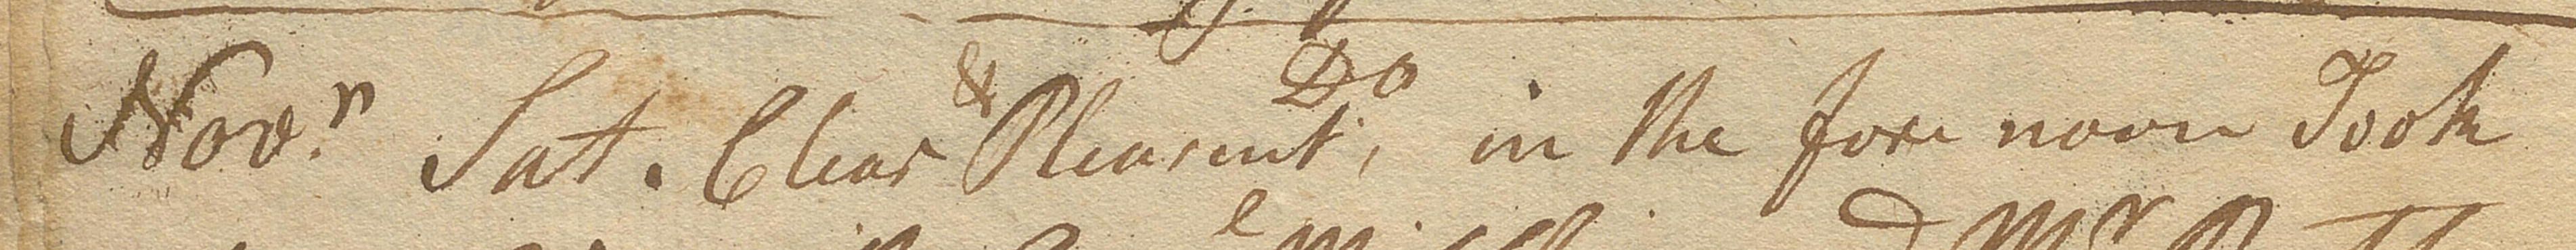Nov^r. Sat. Clear ^& Pleasent, in the fore noon Took
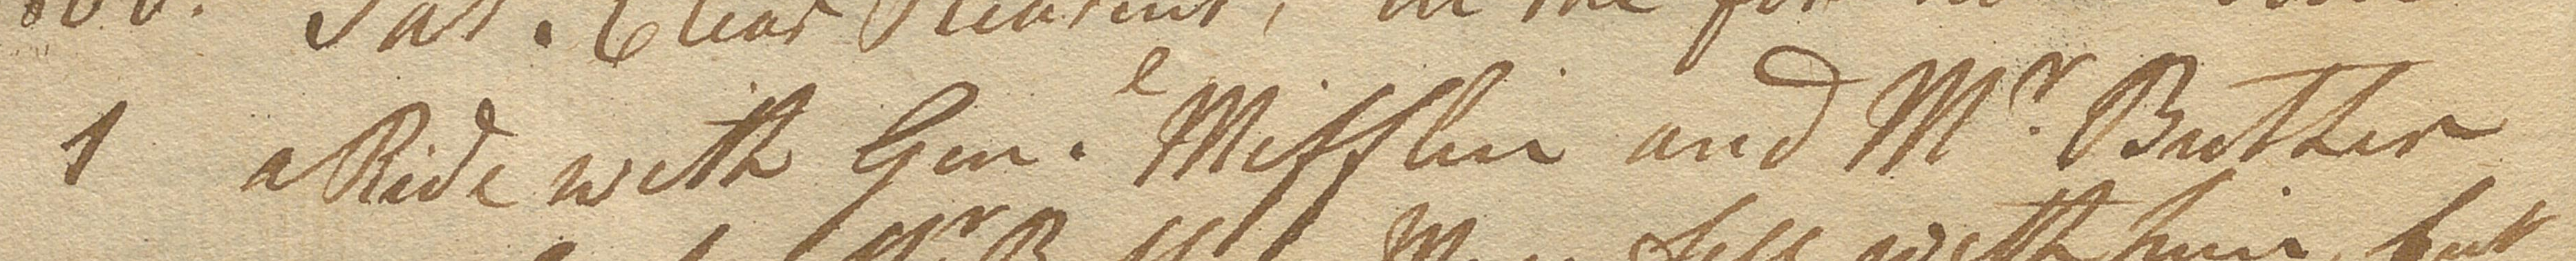1 a Ride with Gen^l. Mifflin and M^r. Butler
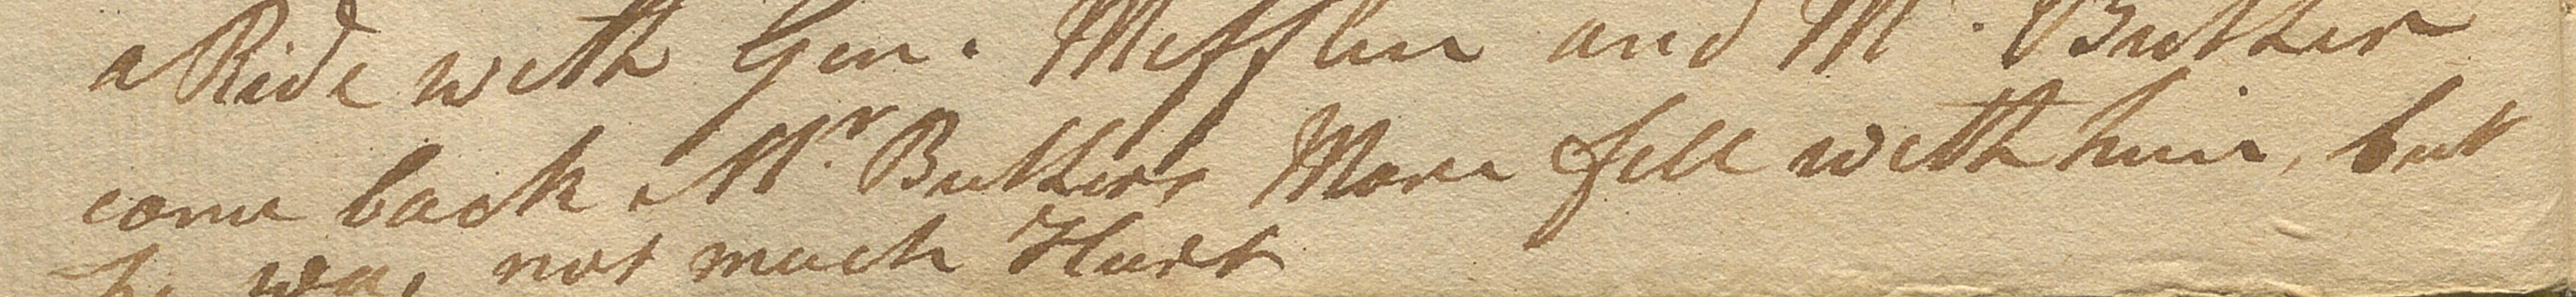came back M^r. Butlers Mare fell with him, but
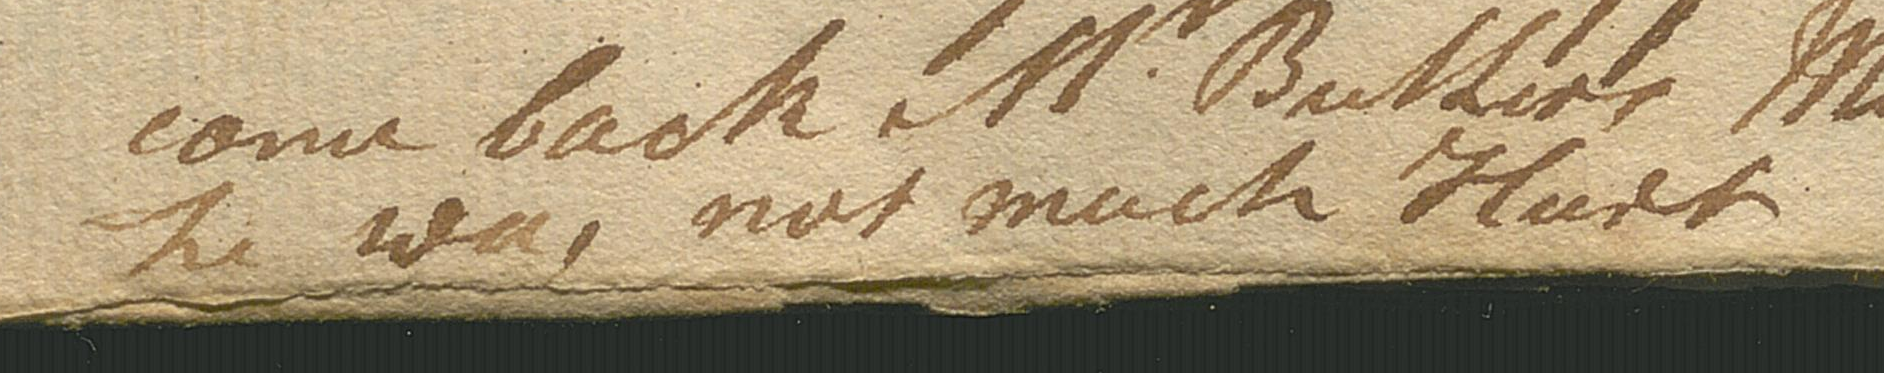he was not much Hurt
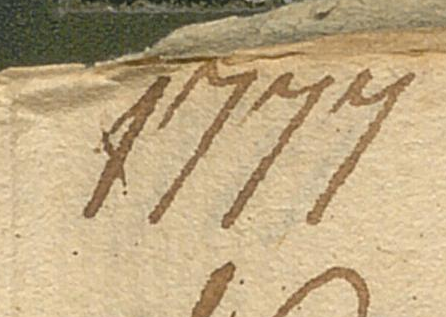1777
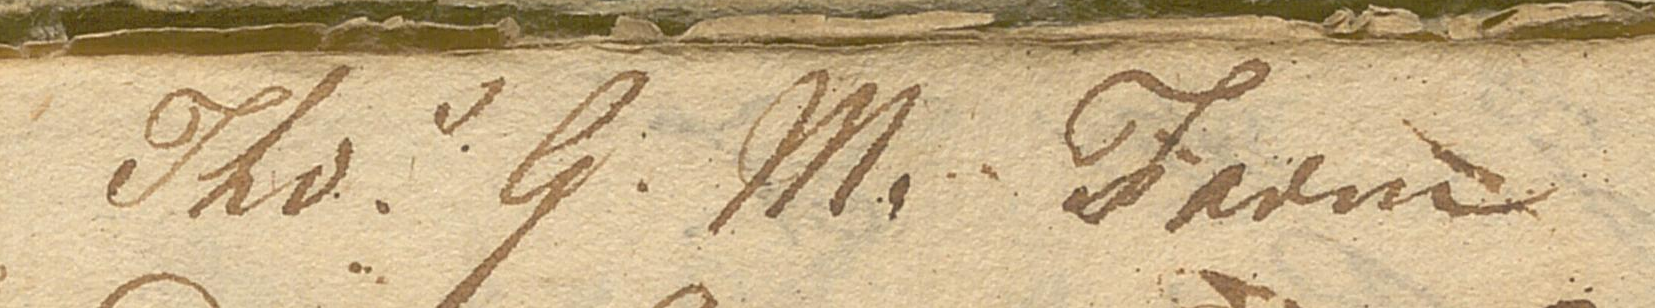Tho^s. G. M. Farm
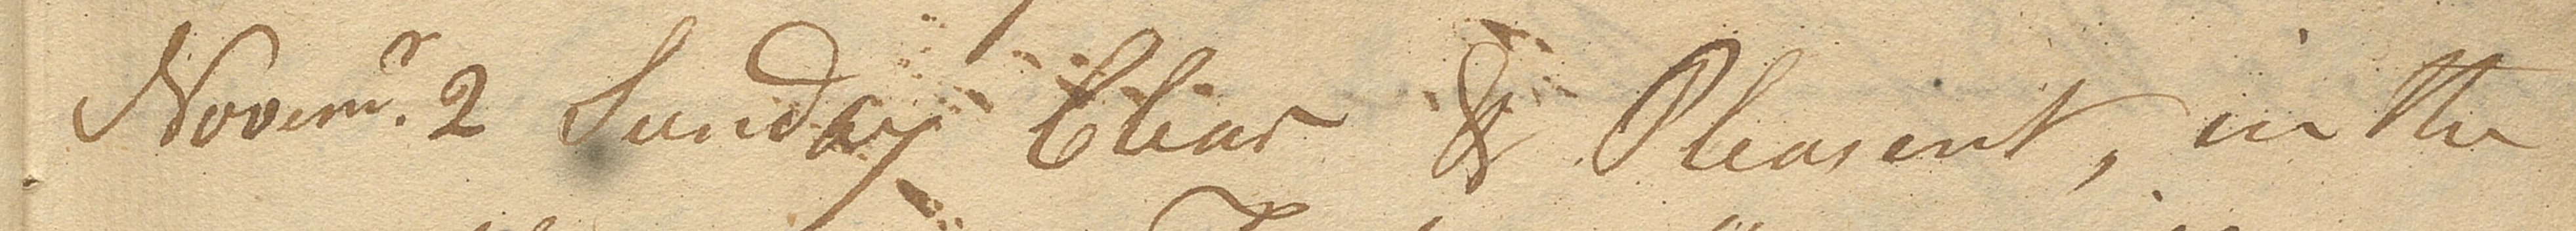Novem^r. 2 Sunday Clear & Pleasent, in the
